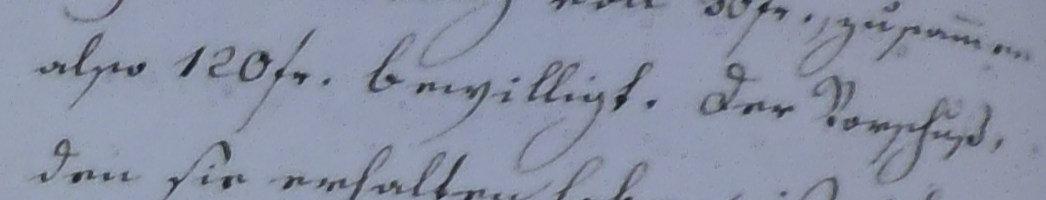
also 120fr. bewilligt. Der Vorschuß,
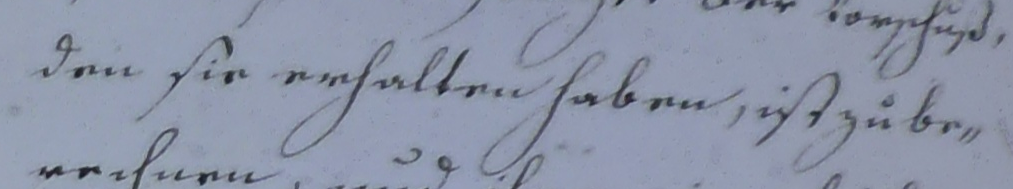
den sie erhalten haben, ist zu be¬
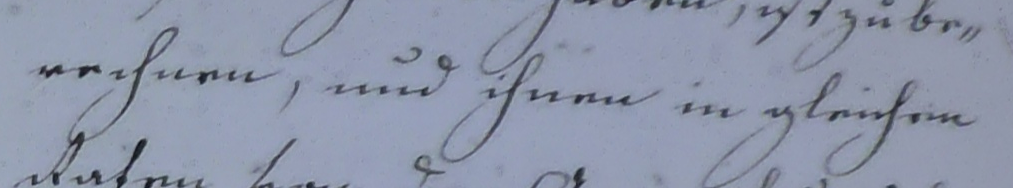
rechnen, und ihnen in gleichen
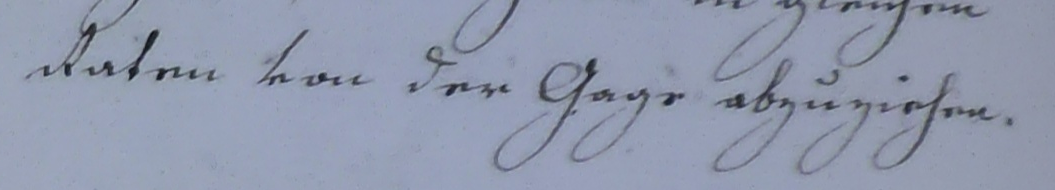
Raten von der Gage abzuziehen.
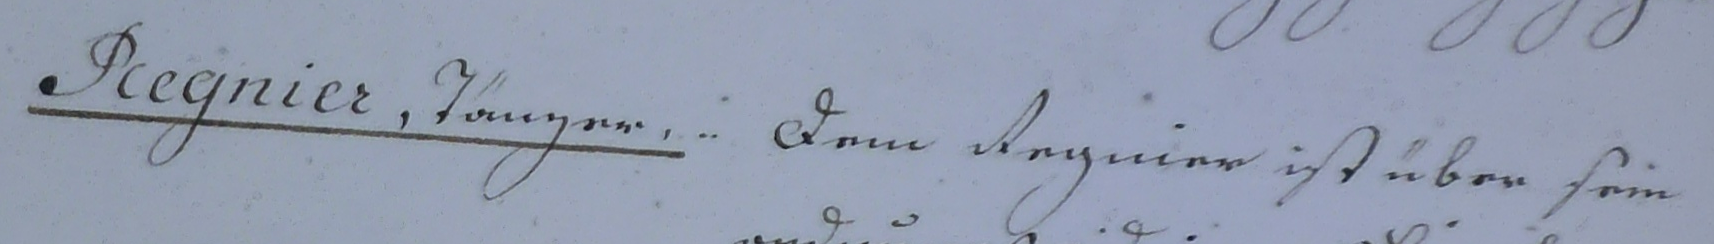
Regnier, Tänzer. .. Dem Regnier ist über sein
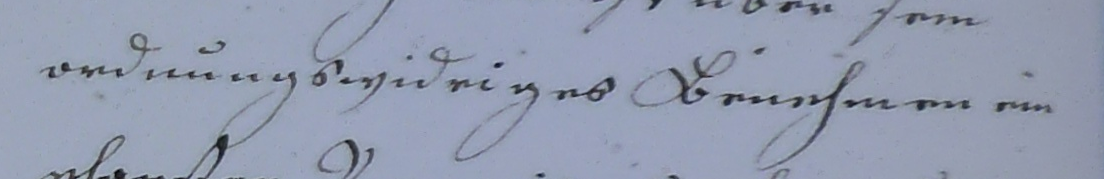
ordnungswidriges Benehmen ein
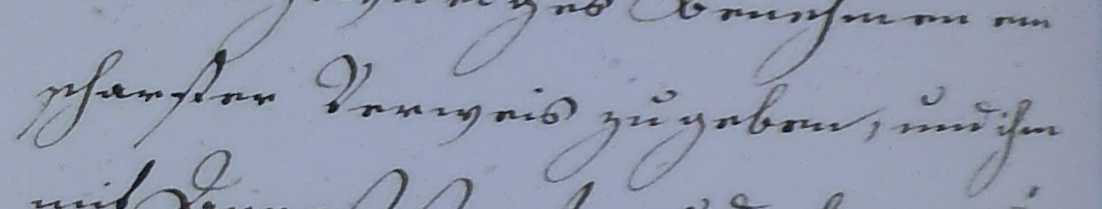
scharfer Verweis zugeben, und ihm
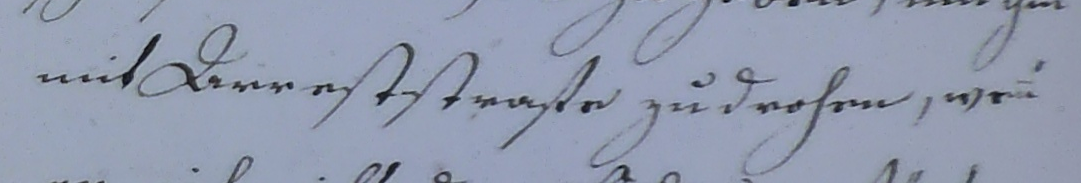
mit Arreststrafe zu drohen, wen̅
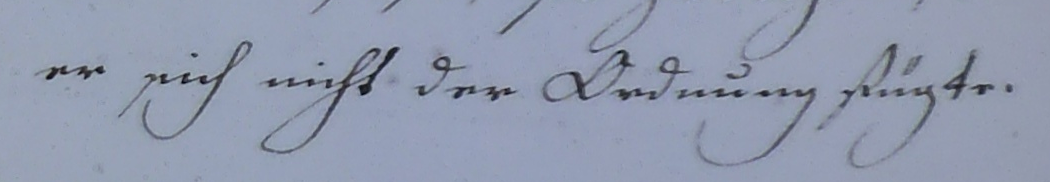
er sich nicht der Ordnung fügte.
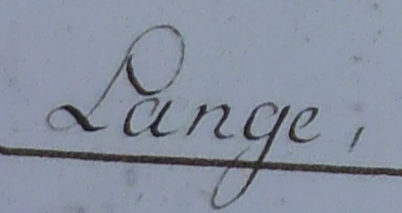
Lange,
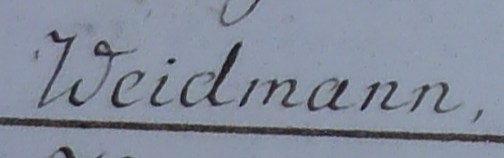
Weidmann,
